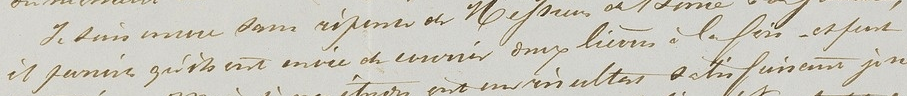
il parait qu'ils ont envie de courrir deux lièvres à la fois – et peut
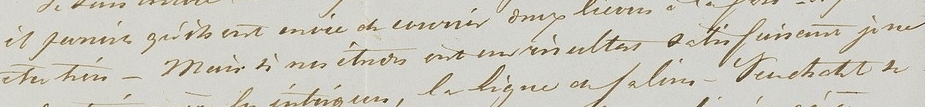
être trois – Mais si nos études ont un résultat satisfaisant je ne
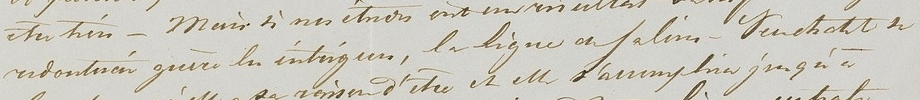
redouterais guère les intrigues, la ligne de Salins–Neuchatel se
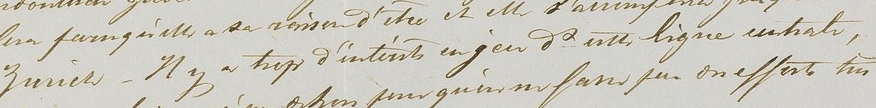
Zurich. Il y a trop d'intérets en jeu ds cette ligne centrale,
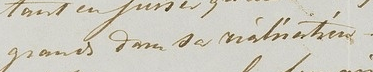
grands dans sa réalisation.
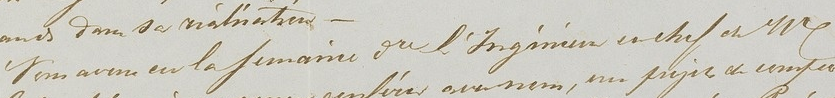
Nous avons eu la semaine dre l'Ingénieur en chef de Mr
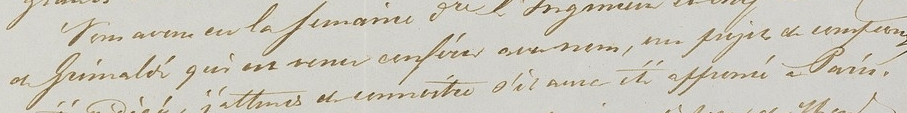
de Grimaldi qui est venu conférer avec nous, un projet de compromis
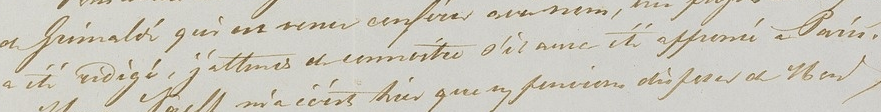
a été rédigé, j'attends de connaitre s'il aura été approuvé à Paris.
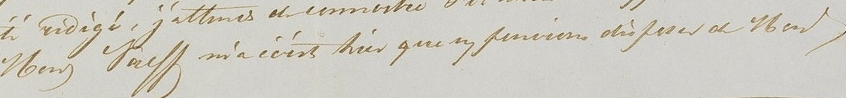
Mons Naeff m'a écrit hier que nous pouvions disposer de Mons
